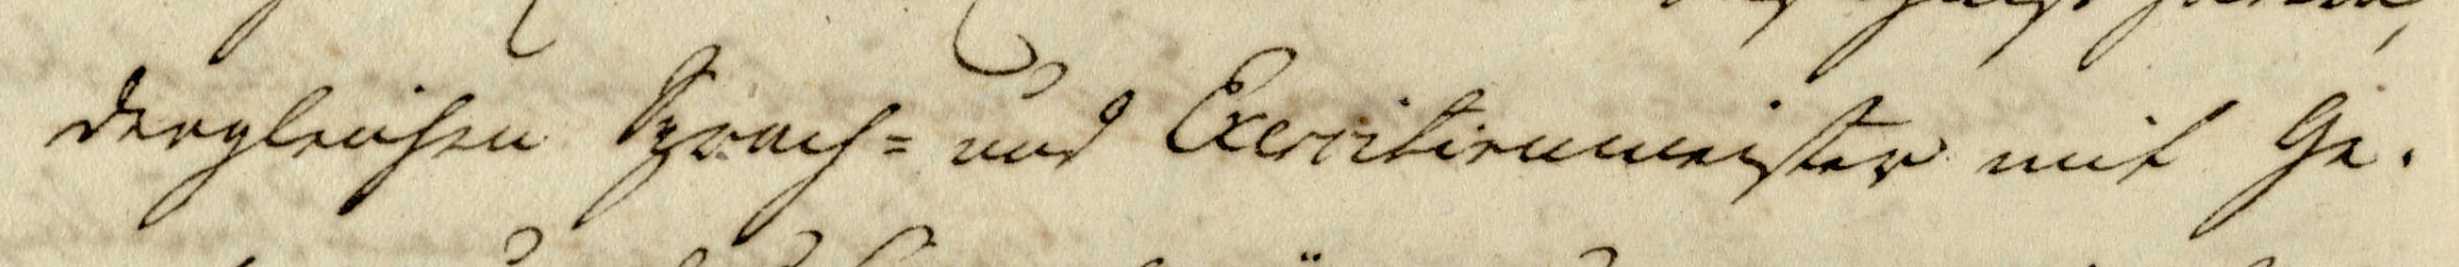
dergleichen Sprach- und Exercitienmeister mit Ge¬
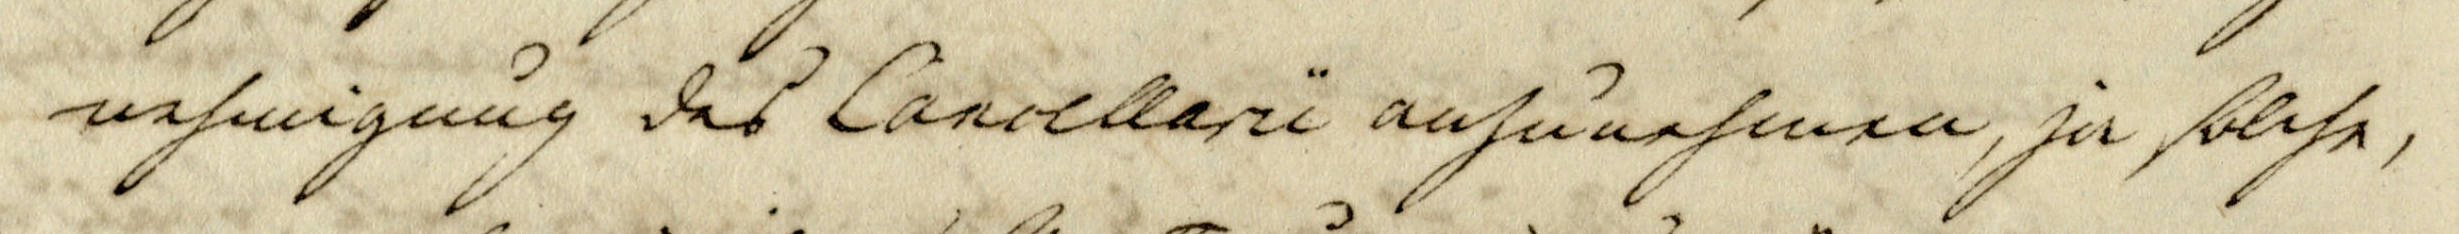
nehmigung des Cancellarii anzunehmen, ja solche,
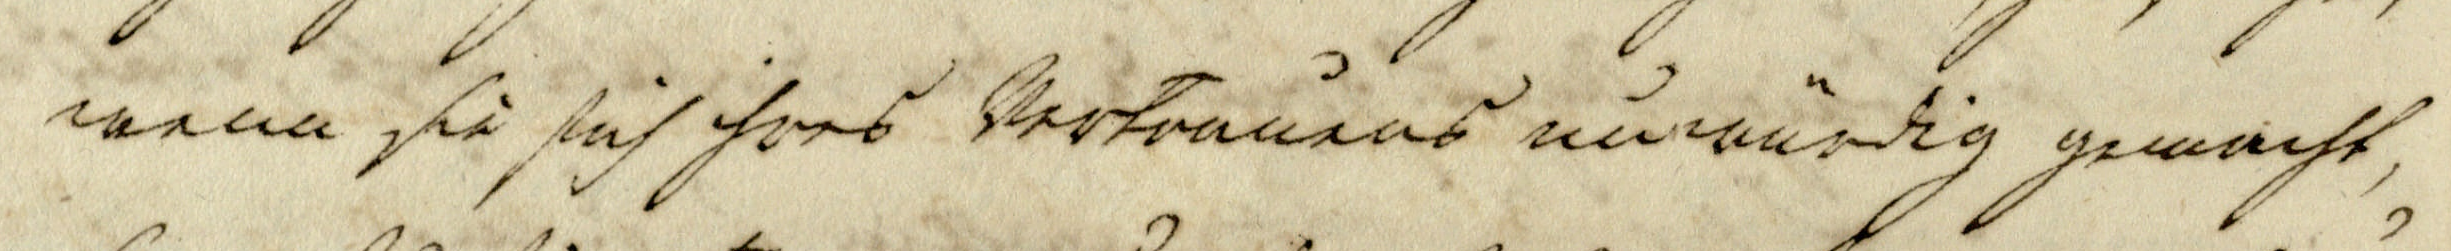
wenn sie sich ihres Vertrauens unwürdig gemacht,
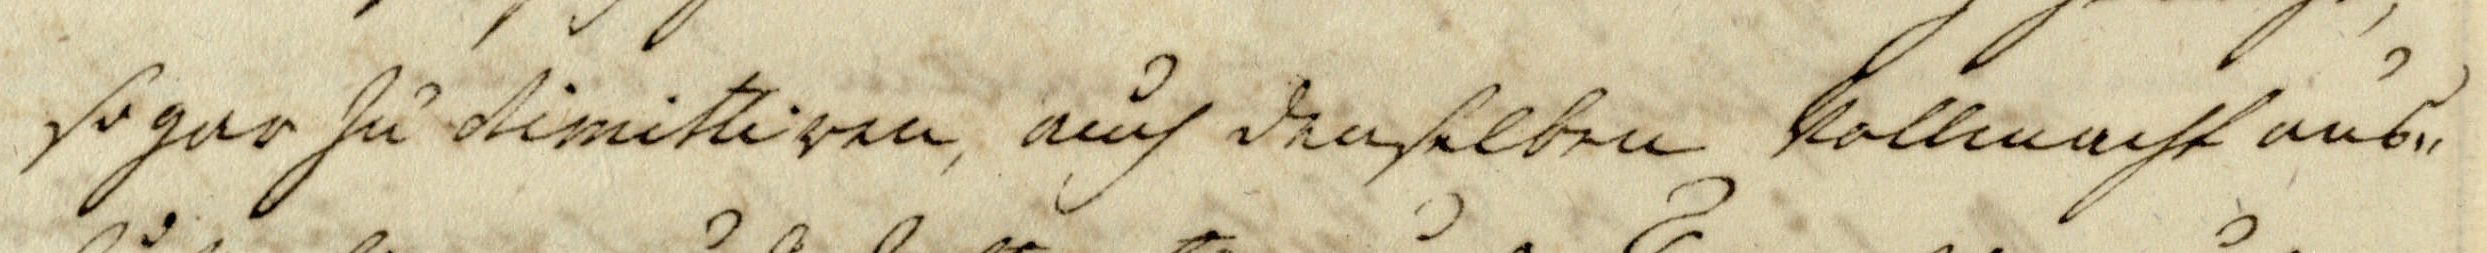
so gar zu demittiren, auch denselben Vollmacht aus¬
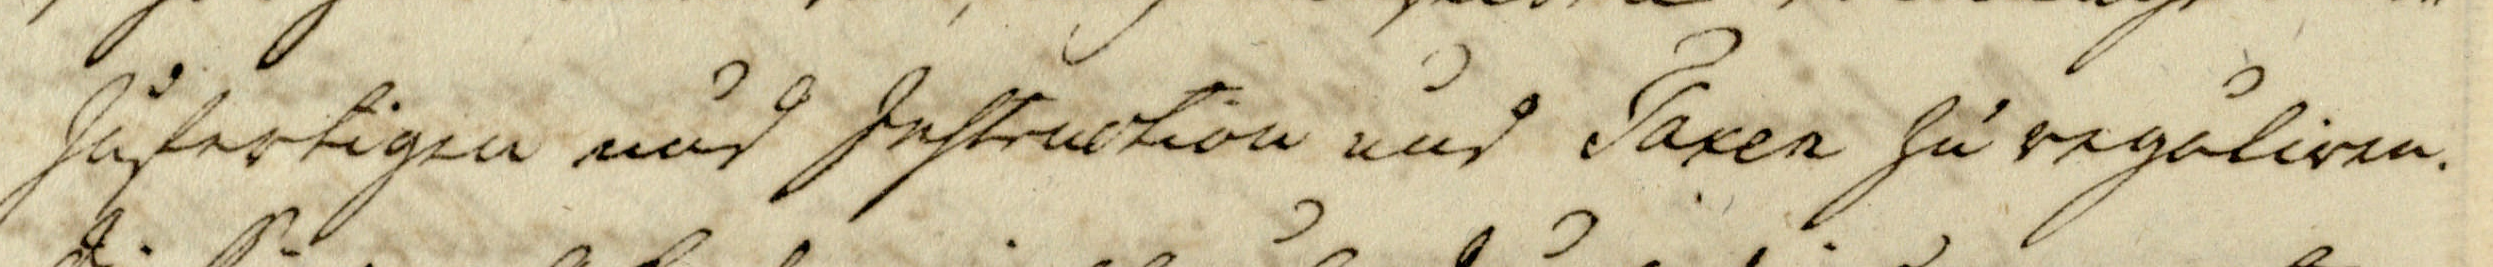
zufertigen und Instruction und Taxen zu reguliren.
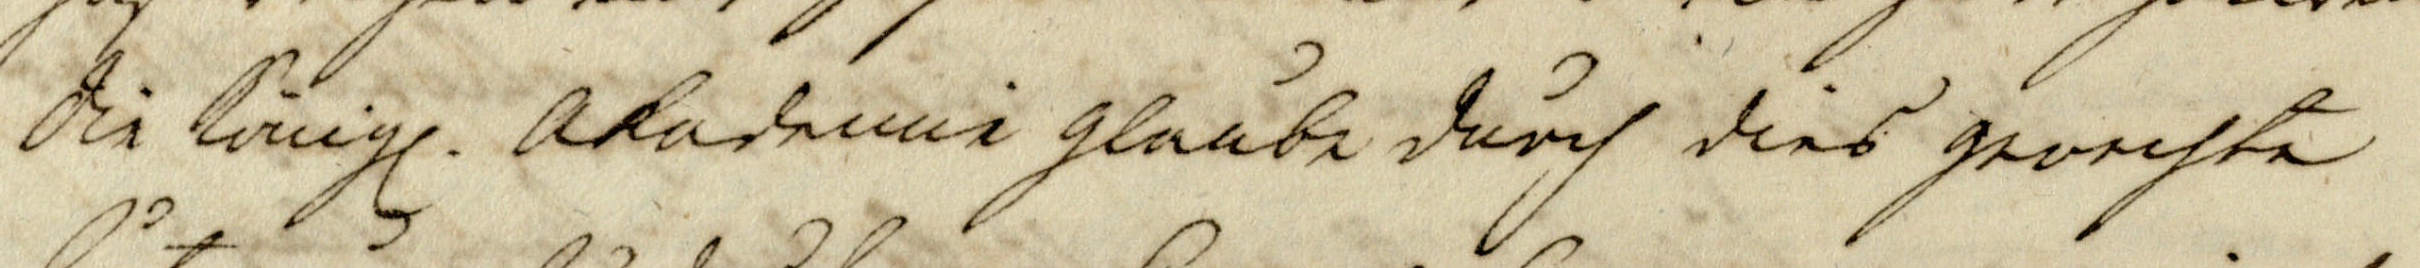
Die Königl. Akademie glaube durch dies gerechte
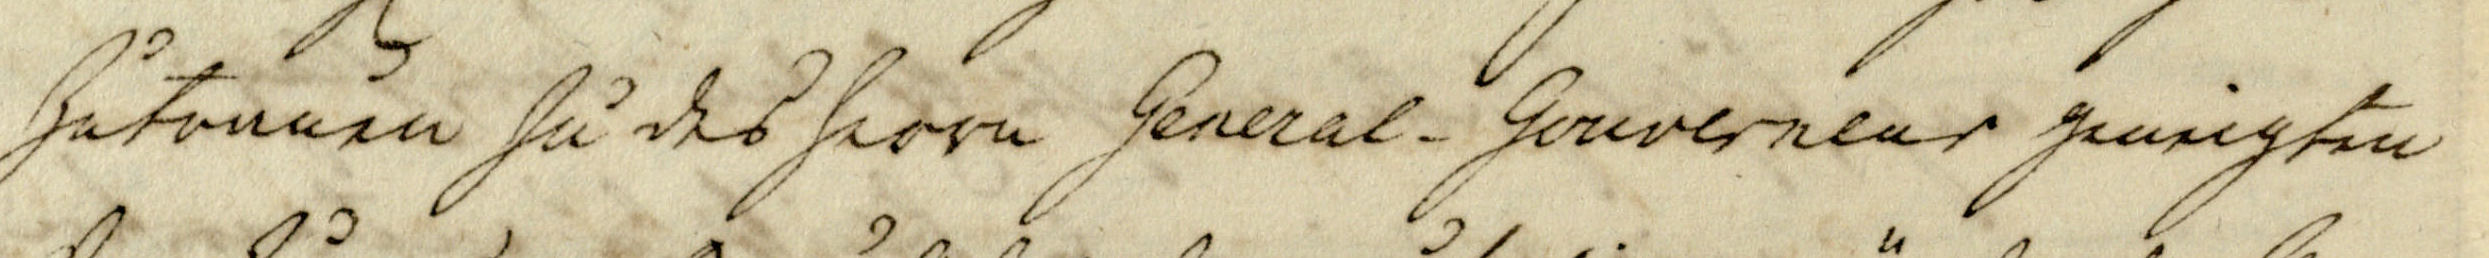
Zutrauen zu des Herrn General- Gouverneur geneigten
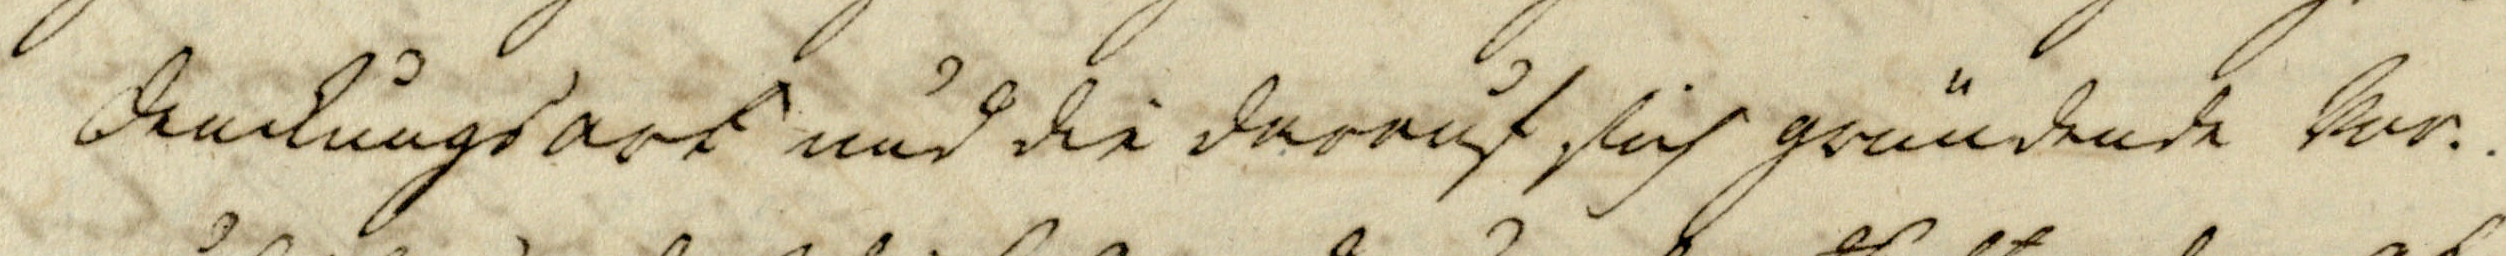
Denckungsart und die darauf sich gründende Vor¬
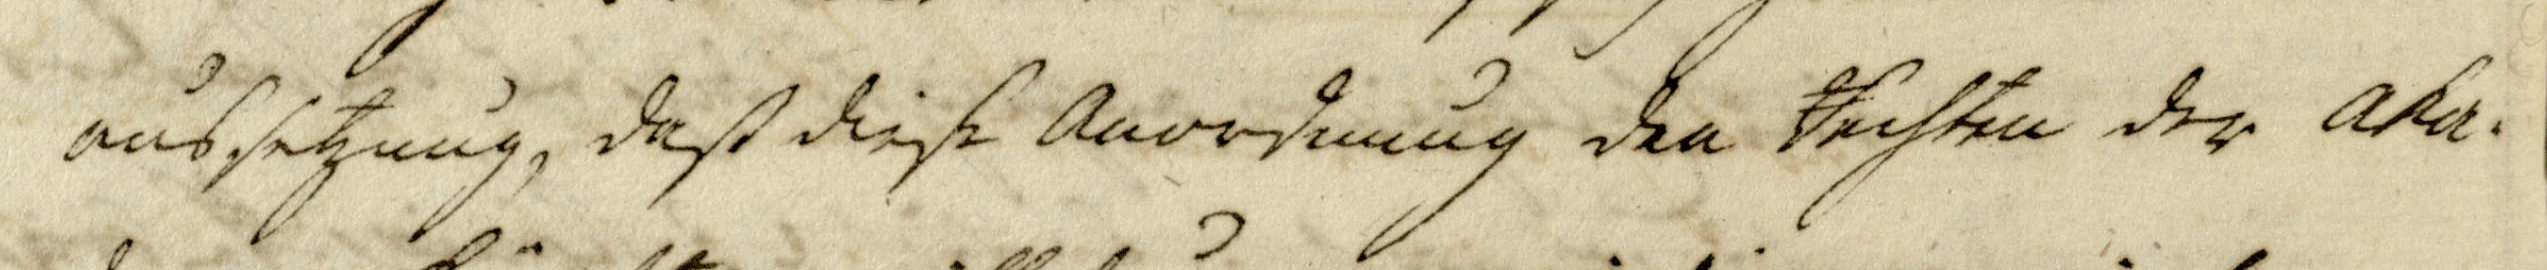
aussetzung, daß diese Anordnung den Rechten der Aka¬
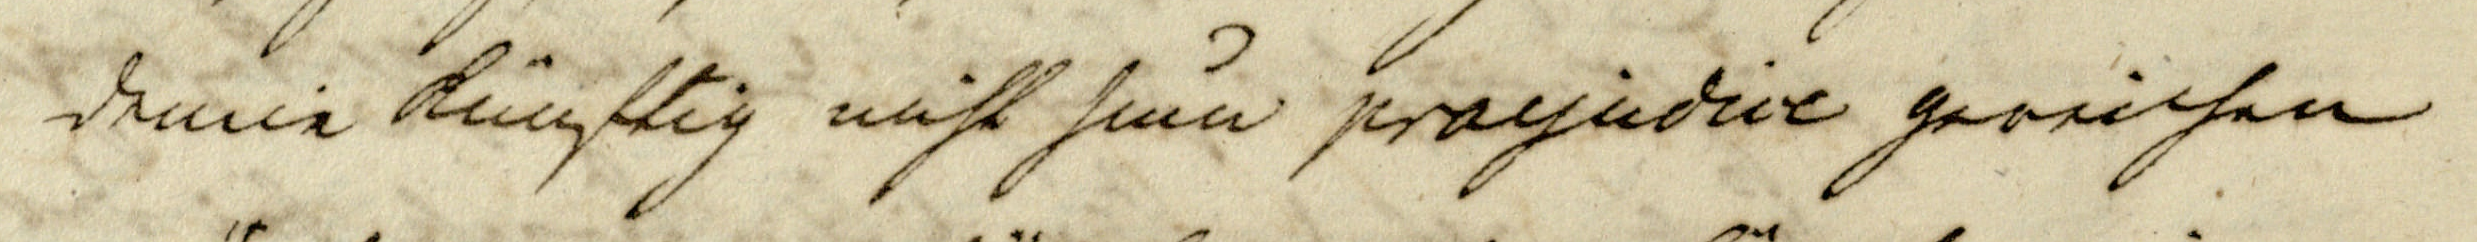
demie künftig nicht zum praejudice gereichen
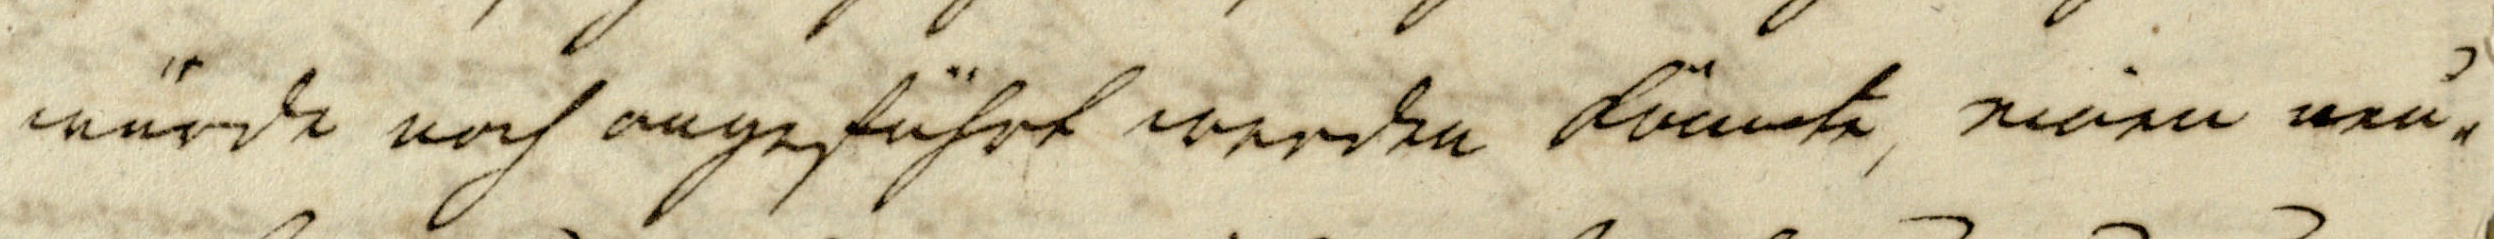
würde noch angeführt werden könnte, einen neu¬
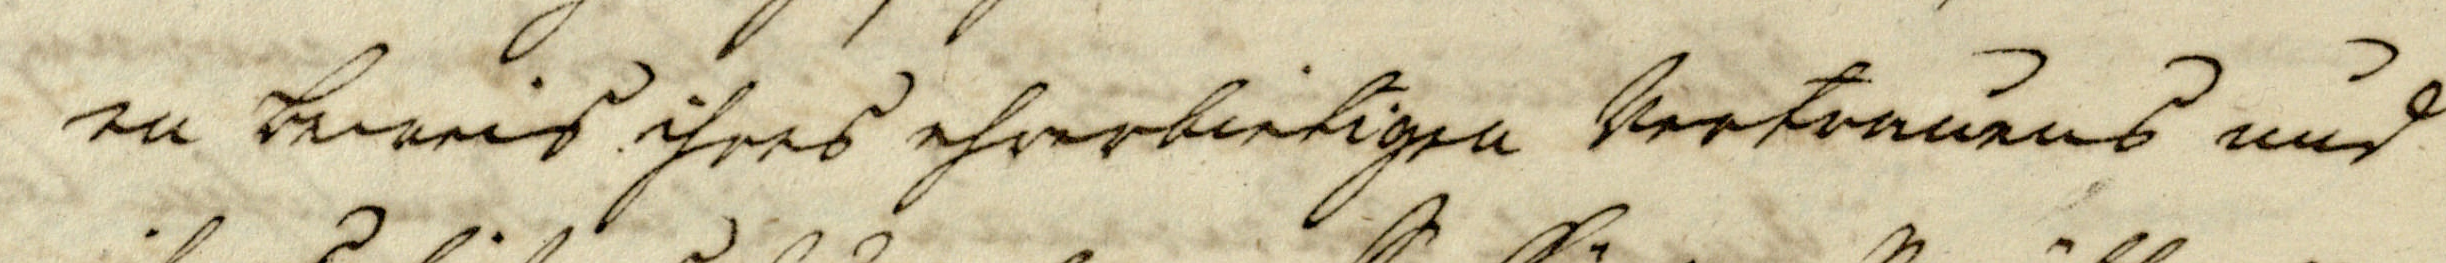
en Beweis ihres ehrerbietigen Vertrauens und
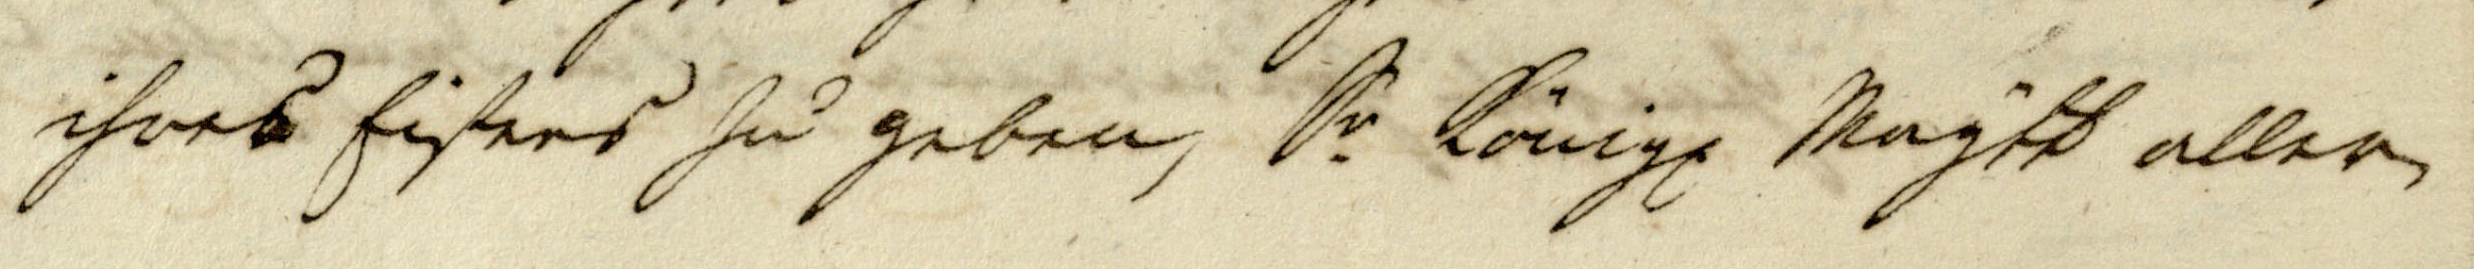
ihres Eifers zu geben, Sr Königl. Maÿtt aller¬
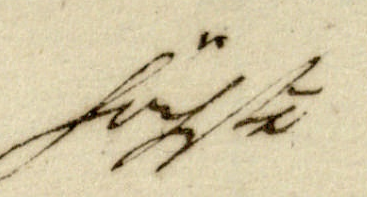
höchste
